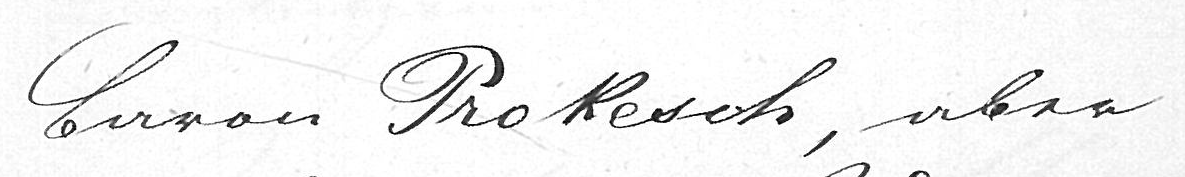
Baron Prokesch, aber
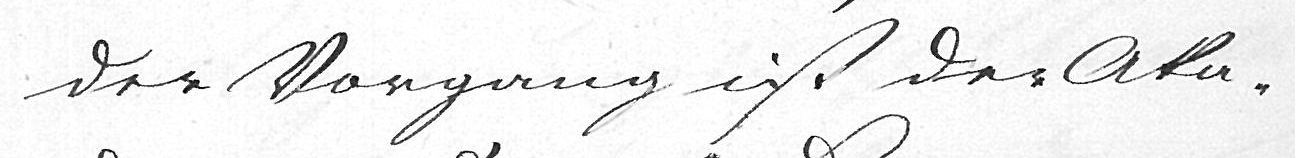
der Vorgang ist der Aka-
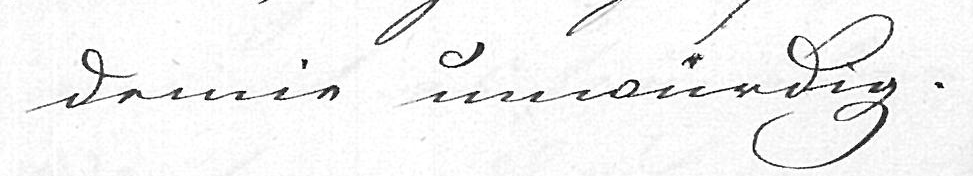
demie unwürdig.
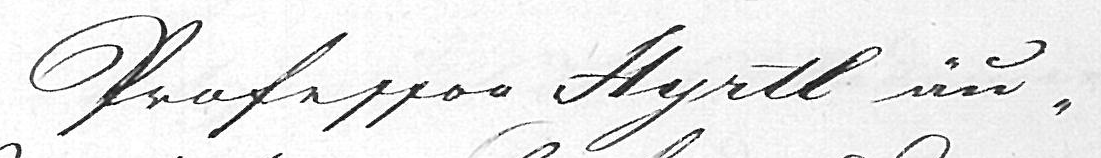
Professor Hyrtl äu-
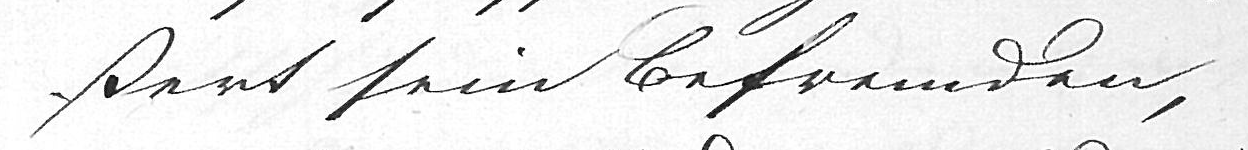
ßert sein Befremden,
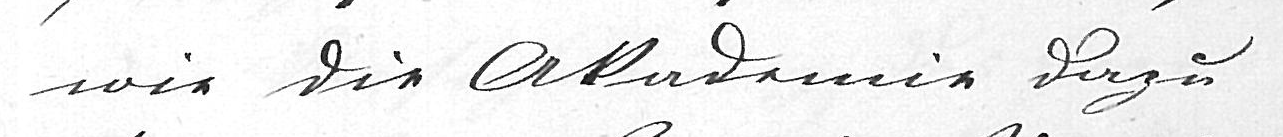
wie die Akademie dazu
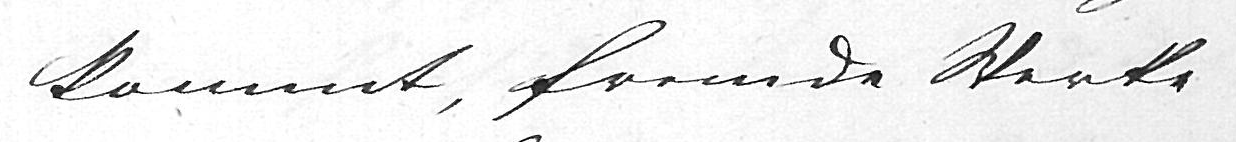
konnte, fremde Werke
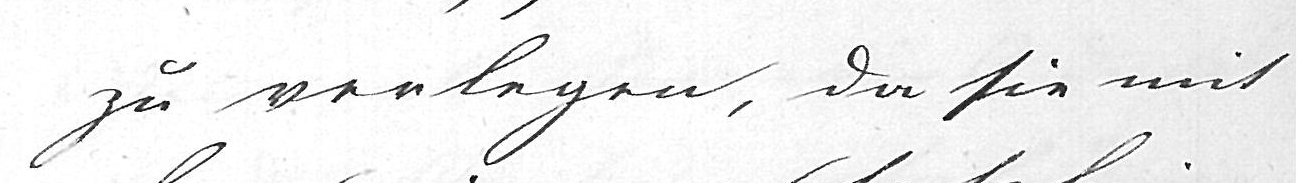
zu verlegen, da sie mit
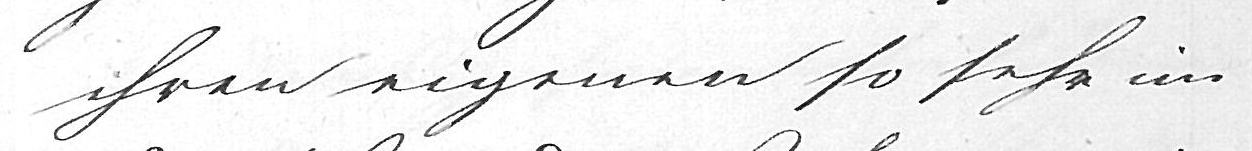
ihren eigenen so sehr im
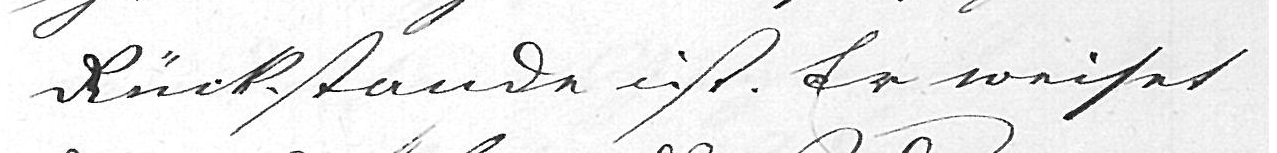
Rückstande ist. Er weiset
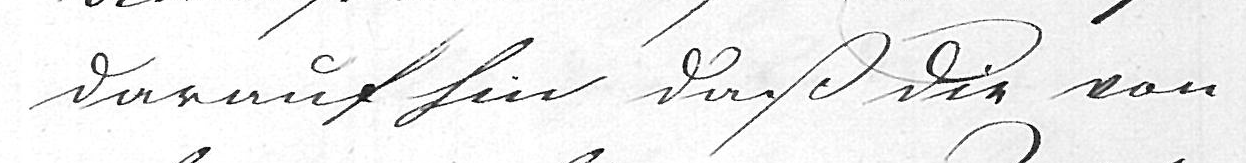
darauf hin daß die von
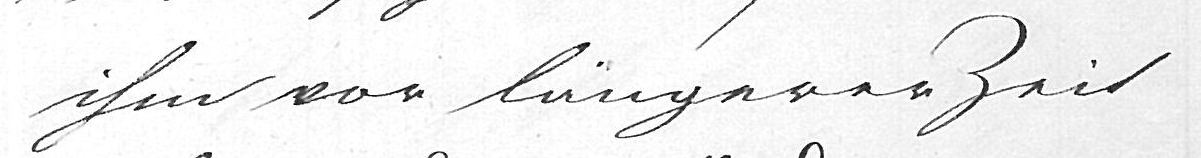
ihm vor längerer Zeit
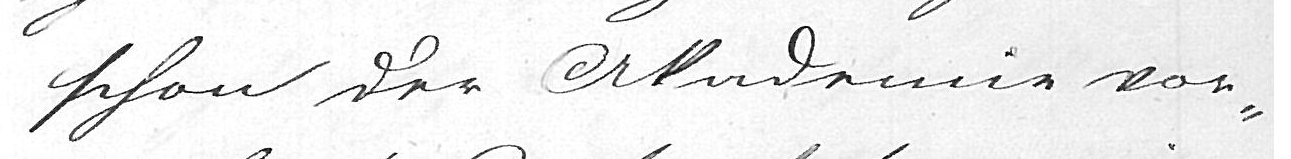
schon der Akademie vor-
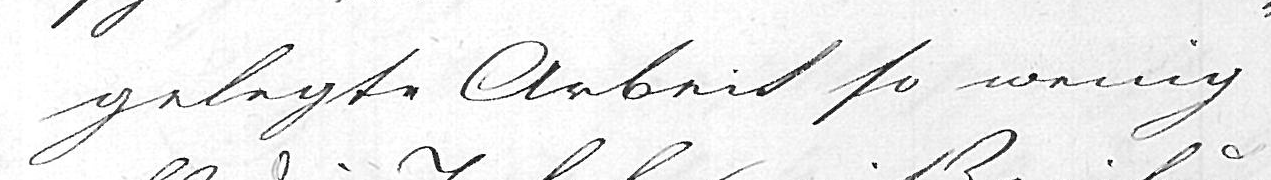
gelegte Arbeit so wenig
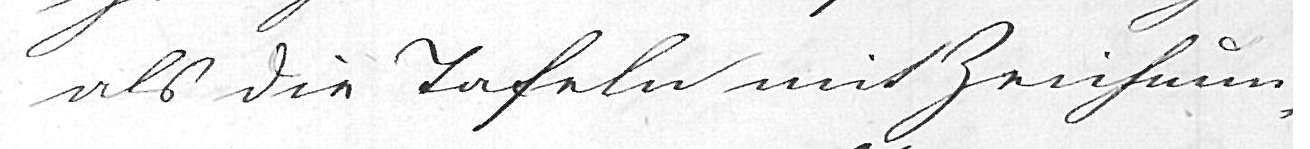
als die Tafeln mit Zeichnun-
